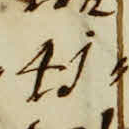41
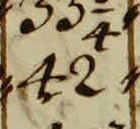42
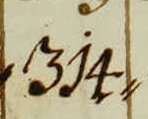314
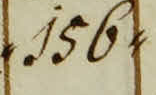156
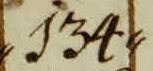134
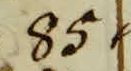85
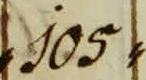105
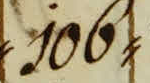106
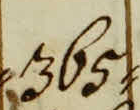365
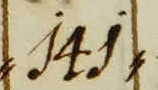141
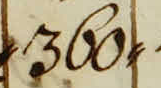360
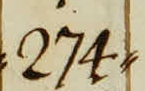274
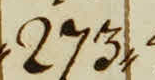273
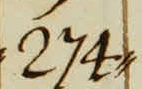274
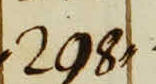298
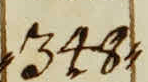348
